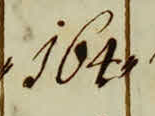164
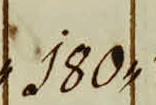180
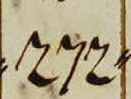272
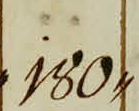180
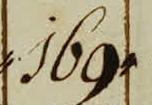169
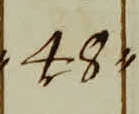48
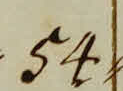54
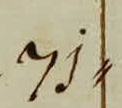71
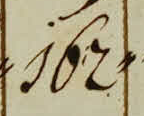162
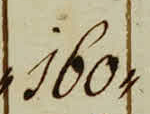160
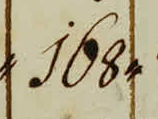168
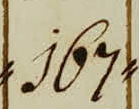167
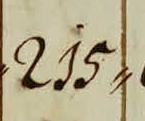215
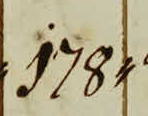178
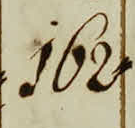162
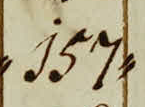157
